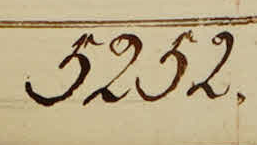5252
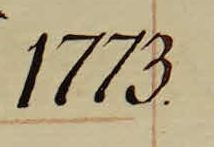1773.
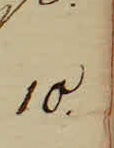10.
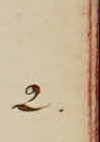2.
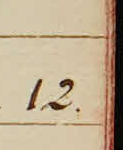12.
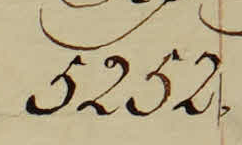5252
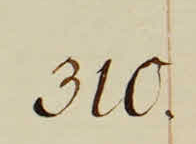310.
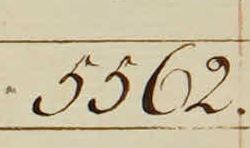5562
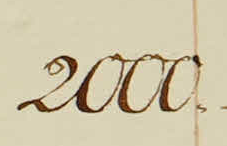2000
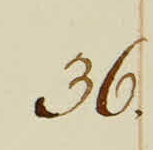36.
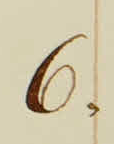6
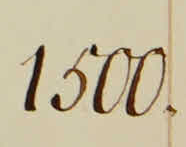1500
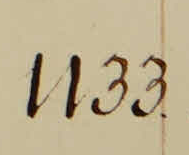1133.
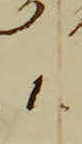1
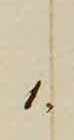1
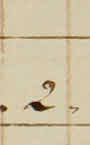2
